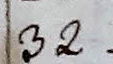32
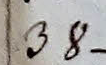38
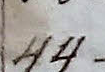44
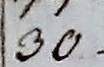30
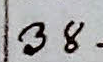38
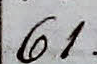61
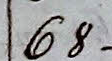68
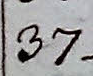37
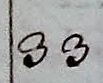33
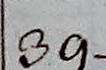39
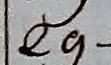29
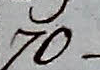70
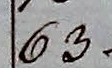63
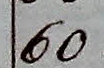60
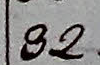32
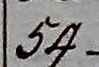54
